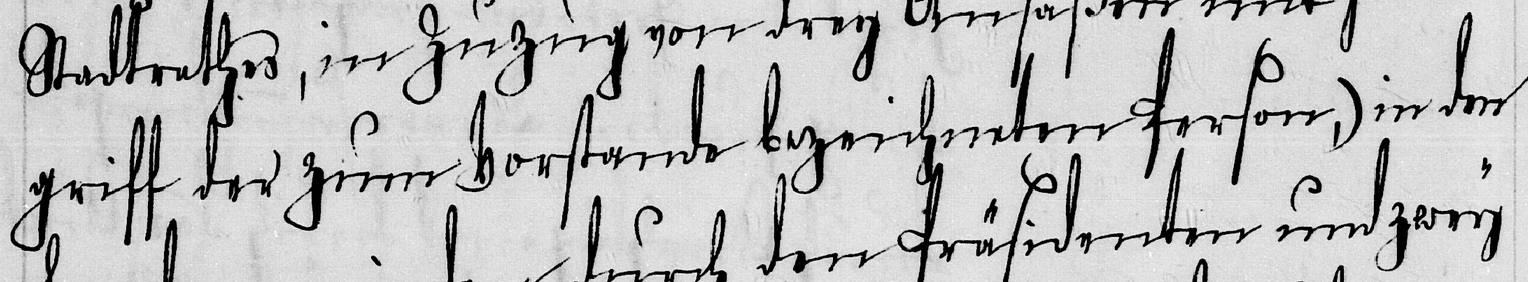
griff der zum Vorstande bezeichneten Person,) in den
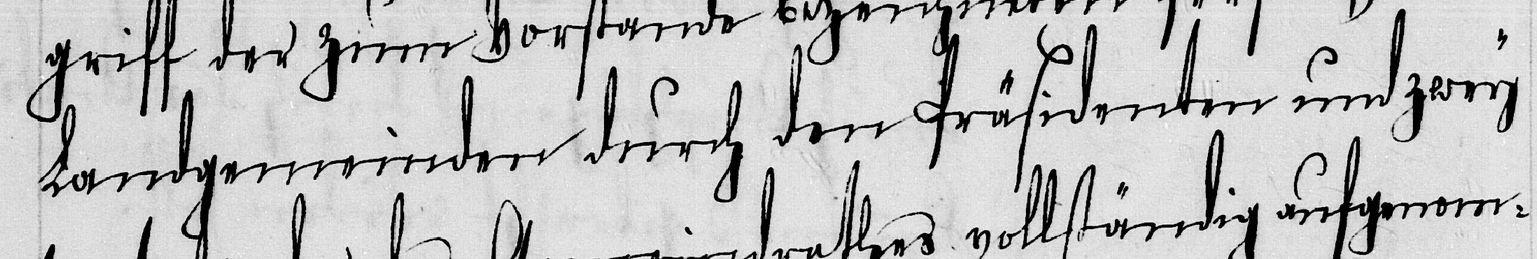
Landgemeinden durch den Präsidenten und zwey
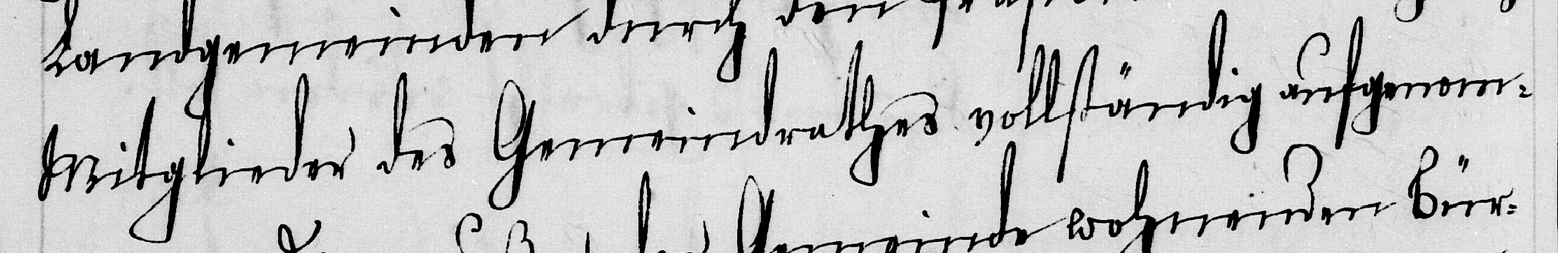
Mitglieder des Gemeindrathes vollständig aufgenom¬
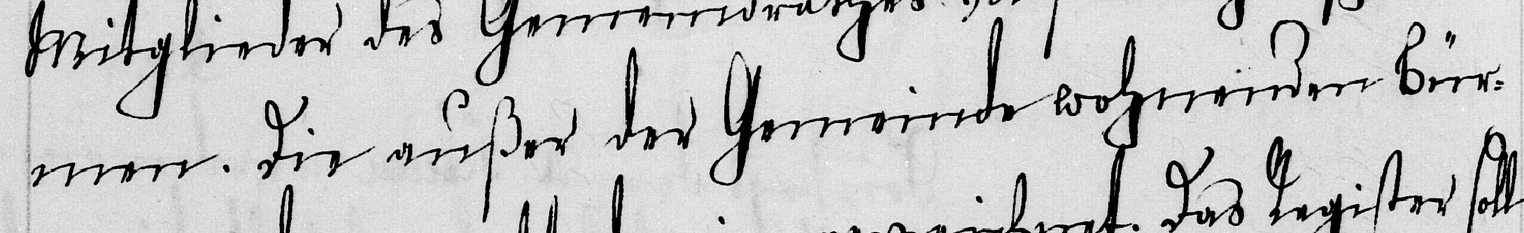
men. Die außer der Gemeinde wohnenden Bür¬
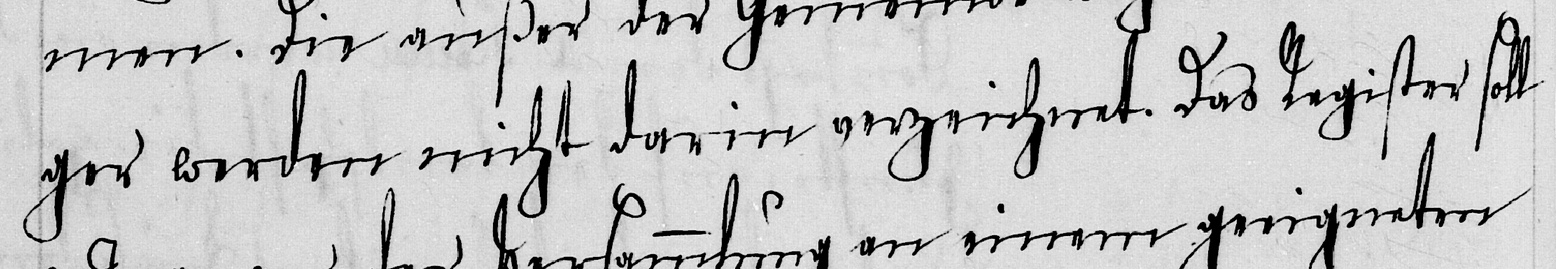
ger werden nicht darin verzeichnet. Das Register sol¬
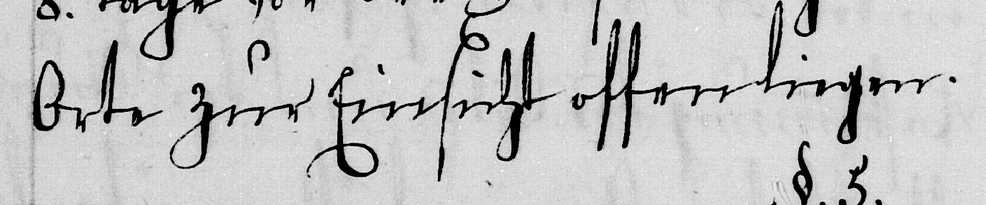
Orte zur Einsicht offen liegen.
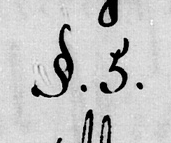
§. 5.
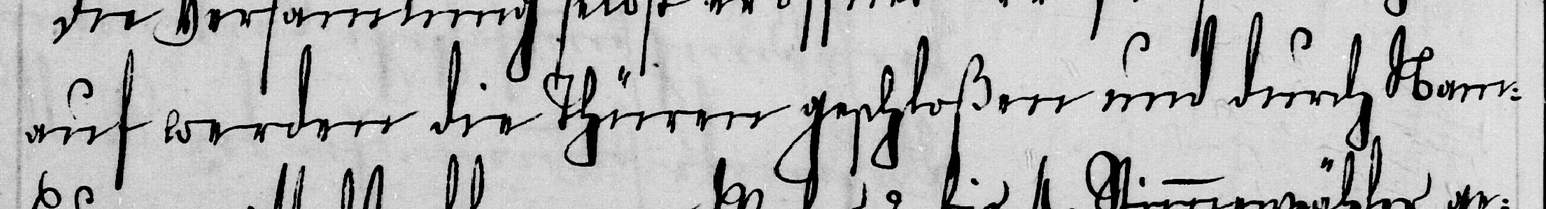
rauf werden die Thüren geschloßen und durch Nam¬
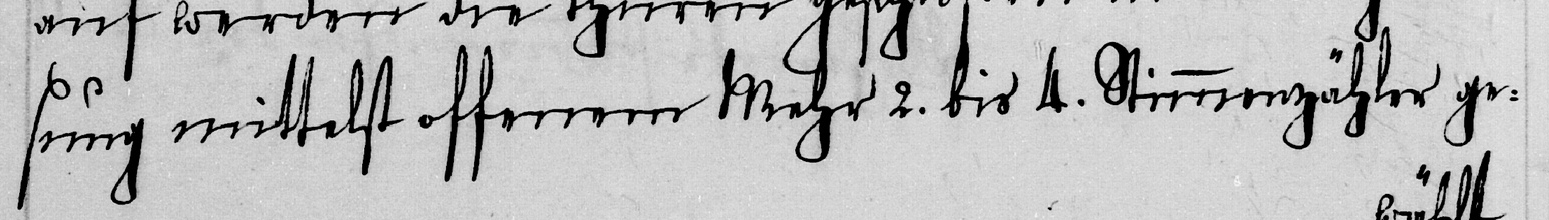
sung mittelst offenem Mehr 2. bis 4. Stimmenzähler ge-
